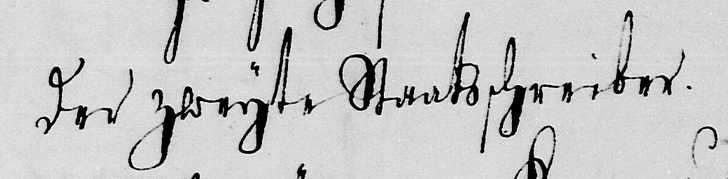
Der zweyte Staatsschreiber.
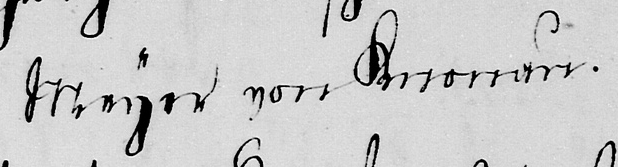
Meyer von Knonau.
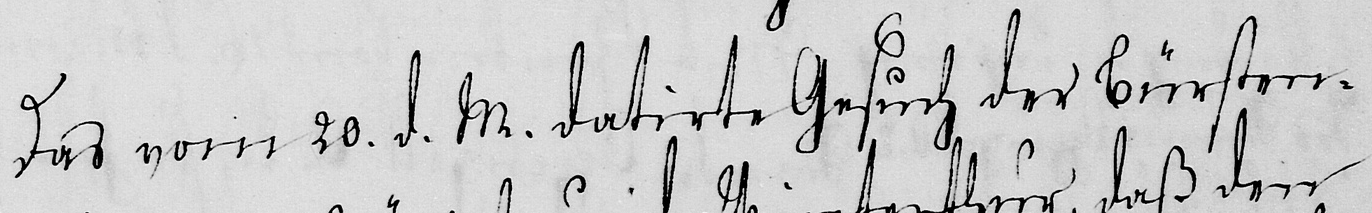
Das vom 20. d. M. datirte Gesuch der Bürsten¬
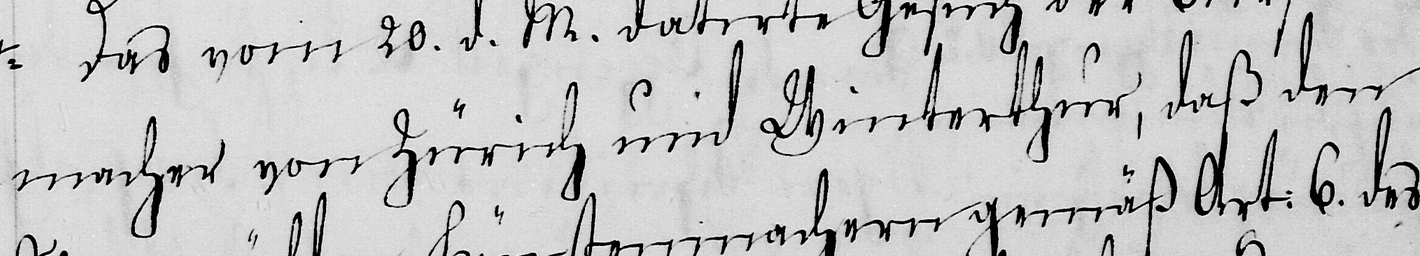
macher von Zürich und Winterthur, daß den
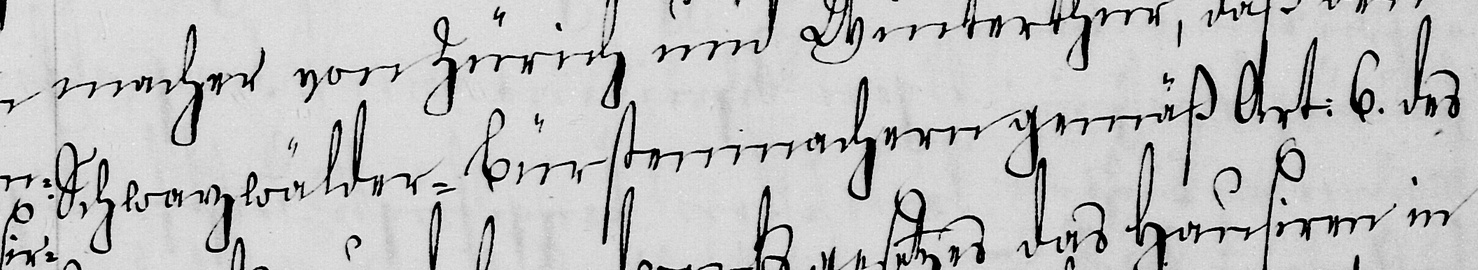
Schwarzwälder-Bürstenmachern gemäß Art: 6. des
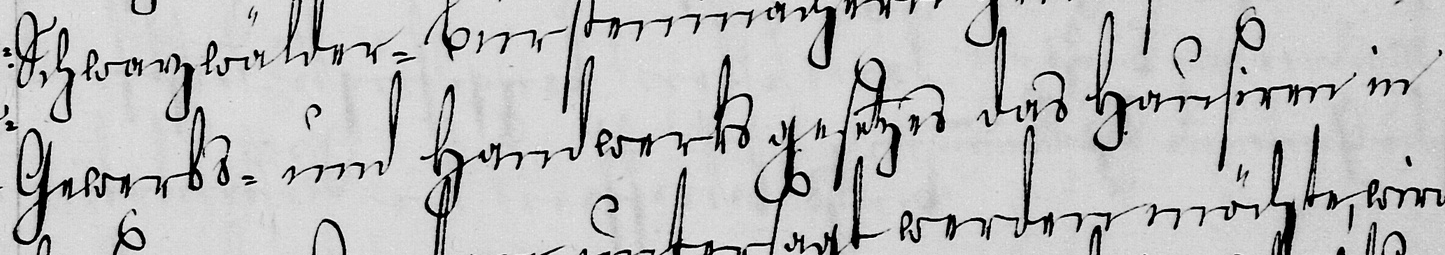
Gewerbs- und Handwerksgesetzes das Hausiren in
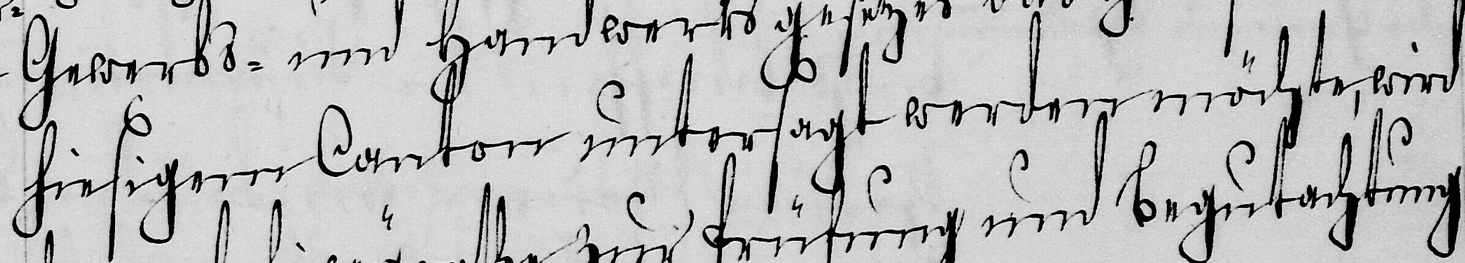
hiesigem Canton untersagt werden möchte, wird
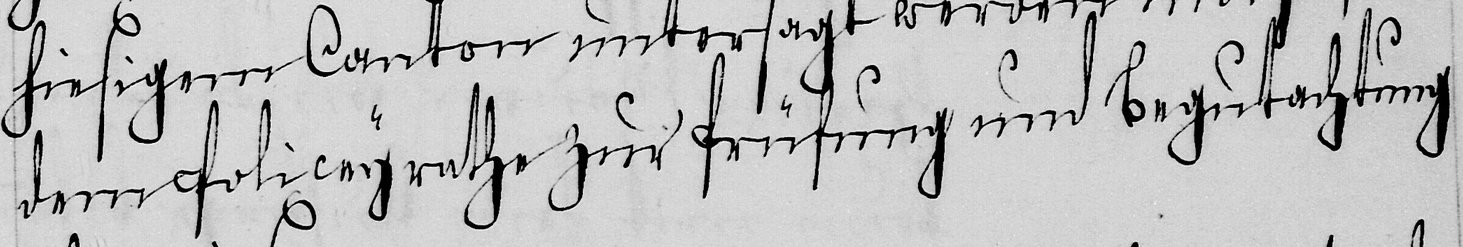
dem Policeyrathe zur Prüfung und Begutachtung
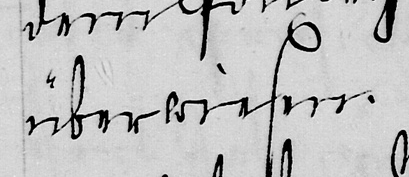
überwiesen.
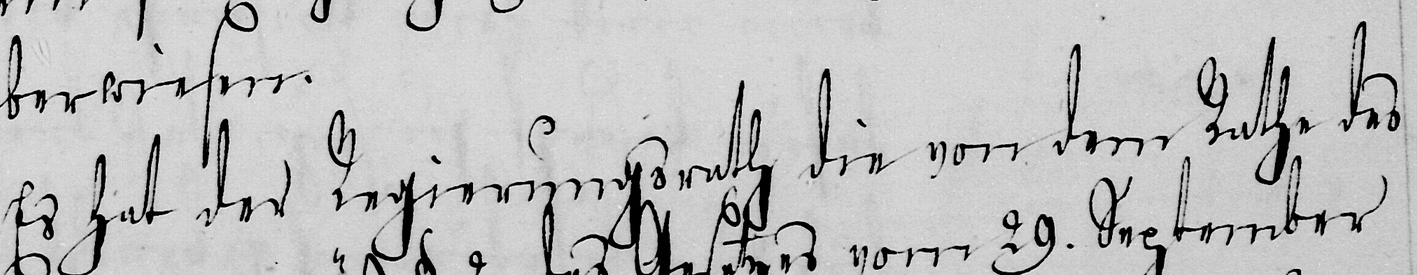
Es hat der Regierungsrath die von dem Rathe des
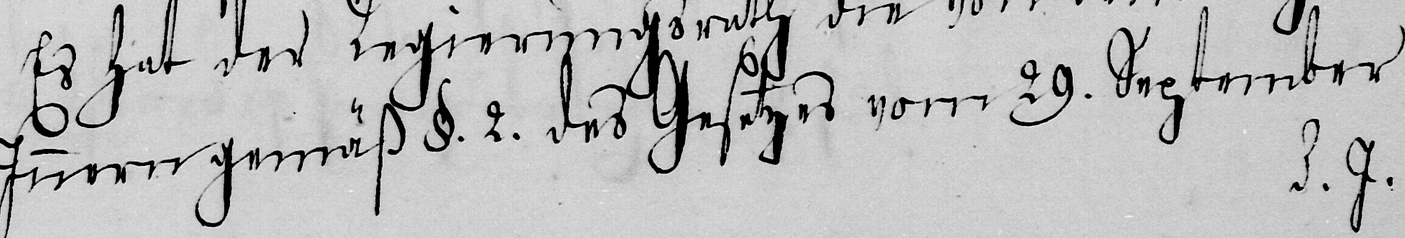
Innern gemäß §. 2. des Gesetzes vom 29. September
